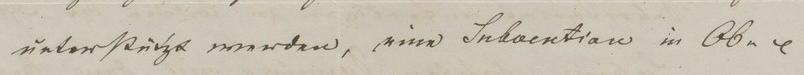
unterstützt werden, eine Subvention in Ob- &
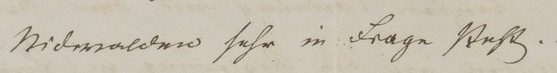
Nidwalden sehr in Frage steht. –
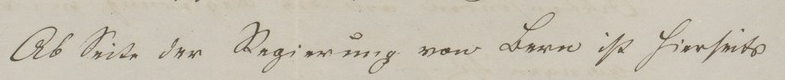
Ab Seite der Regierung von Bern ist hierseits
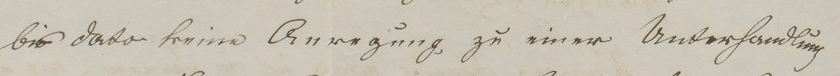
bis dato keine Anregung zu einer Unterhandlung
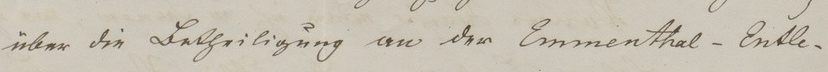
über die Betheiligung an der Emmenthal–Entle-
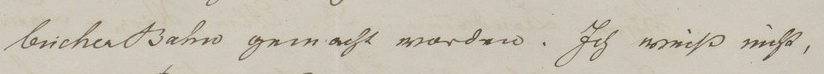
bucher Bahn gemacht worden. Ich weiß nicht,
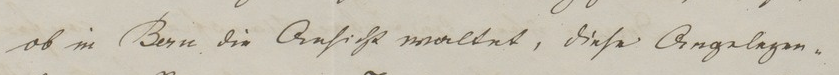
ob in Bern die Ansicht waltet, diese Angelegen-
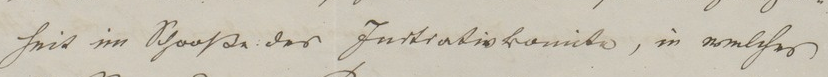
heit im Schooße des Initiativkomite, in welches
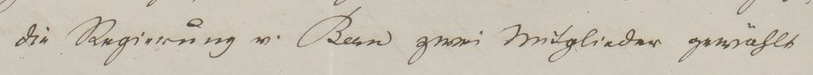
die Regierung v. Bern zwei Mitglieder gewählt
